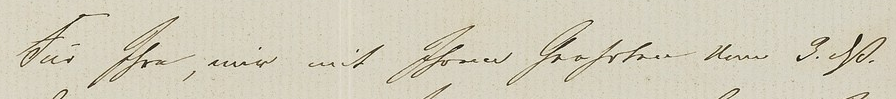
Für Ihre, mir mit Ihrem Geehrten vom 3. dß.
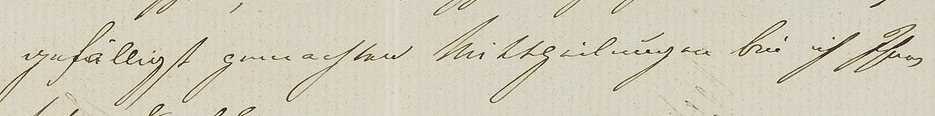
gefälligst gemachten Mittheilungen bin ich Ihnen
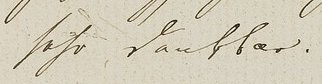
sehr dankbar.
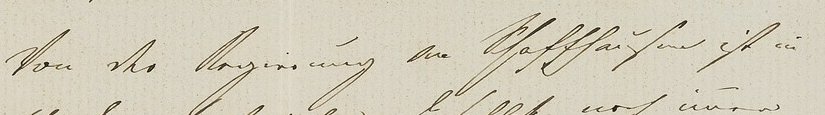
Von der Regierung von Schaffhausen ist in
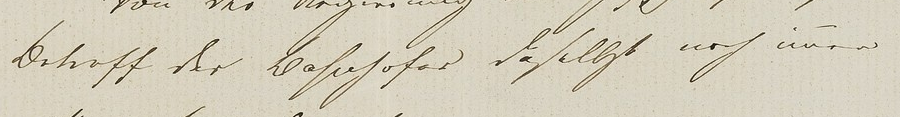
Betreff des Bahnhofes daselbst noch immer
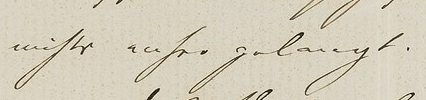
nichts anher gelangt.
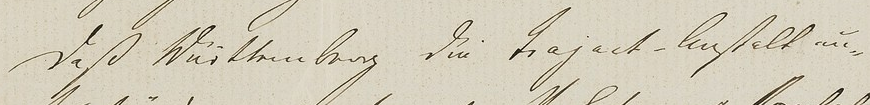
Daß Württemberg die Traject-Anstalt un-
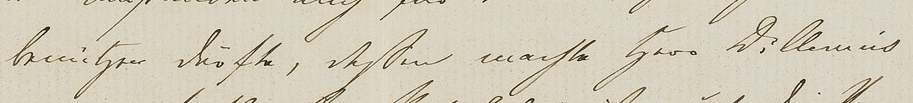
benützen dürfte, dessen machte Herr Dillenius
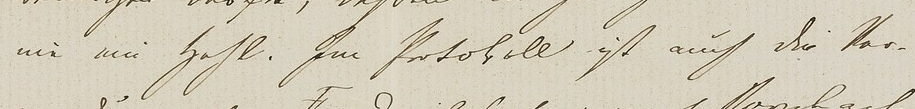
nie ein Hehl. Im Protokoll ist auch die Ver-
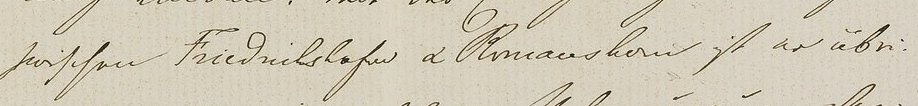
zwischen Friedrichshafen & Romanshorn ist es übri-
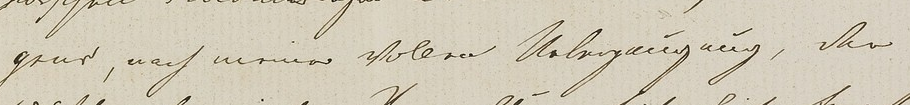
gens, nach meiner vollen Ueberzeugung, der
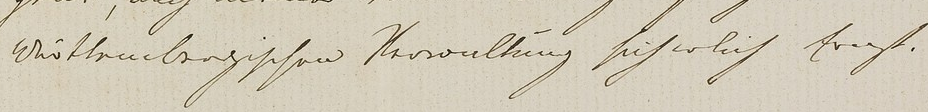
Württembergischen Verwaltung sicherlich Ernst.
